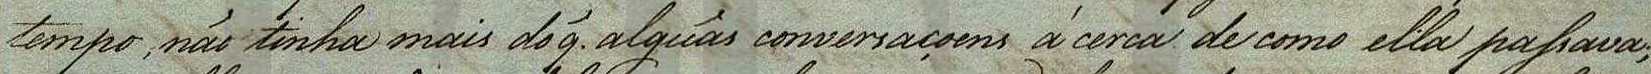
tempo, não tinha mais do q̄ alguās conversaçoens ácerca de como ella passava,
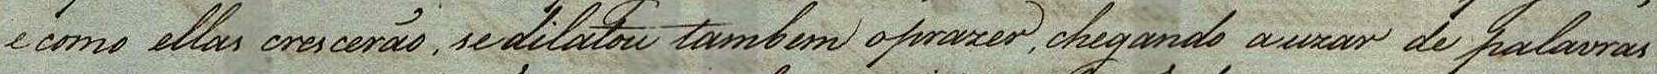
e como ellas crescerão, se dilatou tambem o prazer, chegando a uzar de palavras
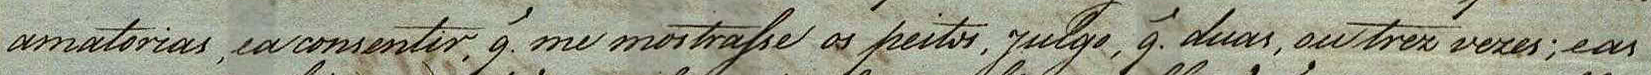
amatorias, e a consentir, q̄ me mostrasse os peitos, julgo, q̄ duas, ou trez vezes; e as
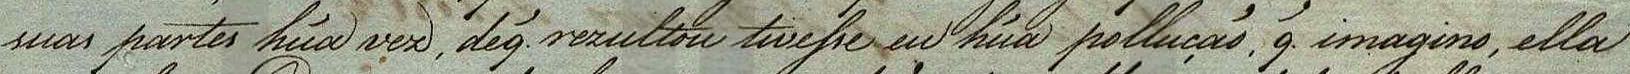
sas partes hūa vez, de q̄ rezultou tivesse eu hūa polluçaõ, q̄ imagino, ella
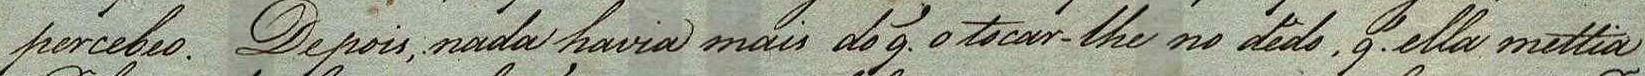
percebeo. Depois, nada havia mais do q̄ o tocar-lhe no dêdo, q̄ ella mettia
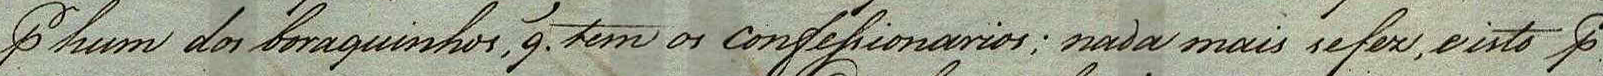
p.a hum dos boraquinhos, q̄ tem os confessionarios: nada mais se fez, e isto p.r
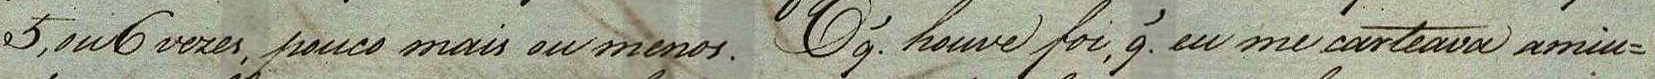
5 ou 6 vezes, pouco mais ou menos. O q̄ houve foi, q̄ eu me carteava amiu
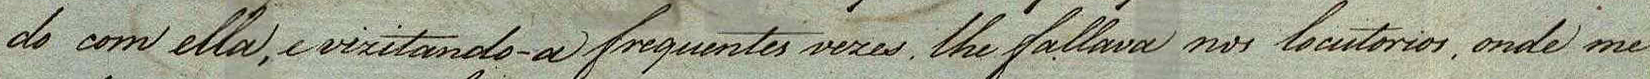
do com ella, e vizitando-a frequentes vezes lhe fallava nos locutorios, onde me
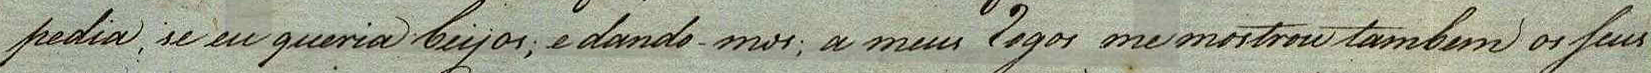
pedia se eu queria beijos; e dando-mos a meu Rogos me mostrou tambem os seus
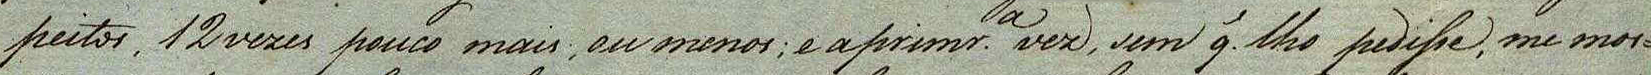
peitos, 12 vezes pouco mais ou menos; e a primr.a vez, sem q̄ lho pedisse, me mos
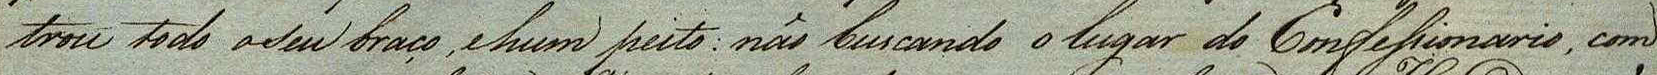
trou todo o seu braço, e hum peito: nãp buscando o lugar do Confessionario, com
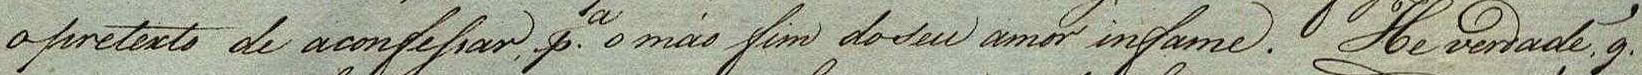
o pretexto de a confessar p.a o máo fim do seu amor infame. He verdade q̄
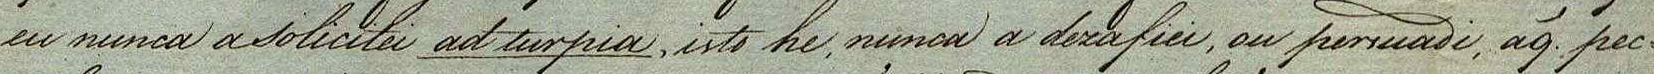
eu nunca a solicitei ad turpia, isto he, nunca a dezafiei, ou persuadi, a q̄ pec
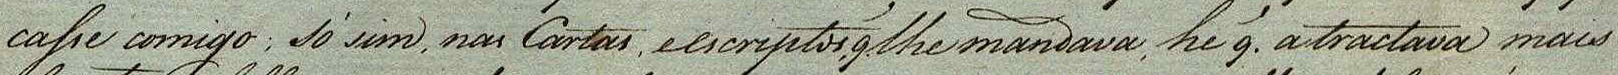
casse comigo; só sim nas Cartas, e escriptos, q̄ lhe mandava he q̄ a tractava mais
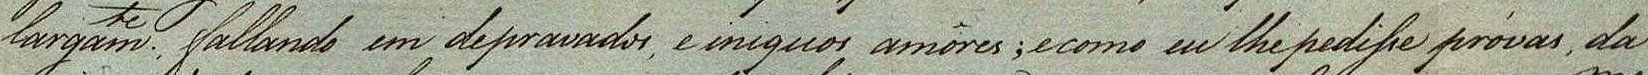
largam.te fallando em depravados, e iniquos amôres; e como eu lhe pedisse próvas, da
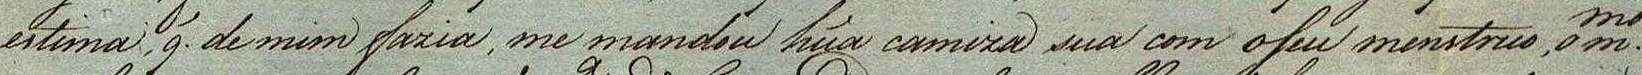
estima, q̄ de mim fazia, me mandou hūa camiza sua com o seu menstruo, o m.mo
